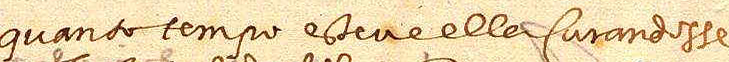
quanto tempo esteue ella Curandosse
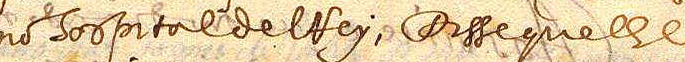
no hospital del Rey, Disse que lhe
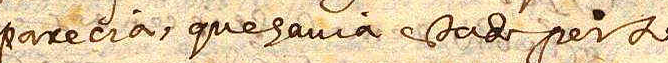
parecia, que hauia estado perto
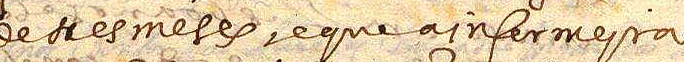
de tres meses, e que a infermejra
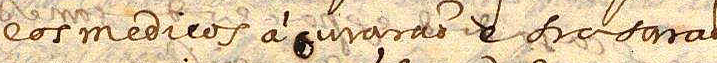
e os medicos á curaraõ e trataraõ
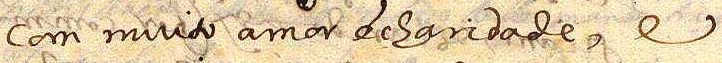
com muito amor e charidade, e
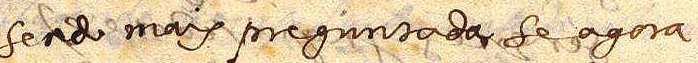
sendo mais preguntada se agora
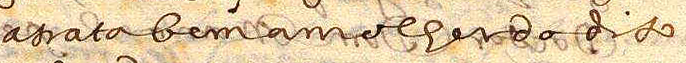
a trata bem a molher do dito
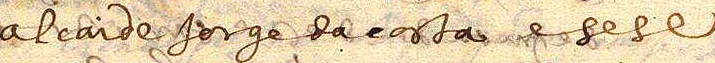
alcaide Jorge da costa e se se
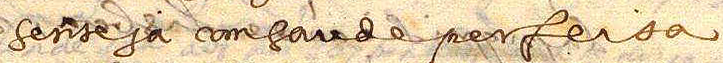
sente ja com saude perfeita
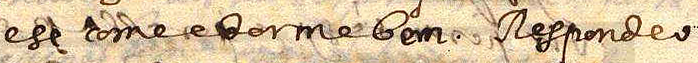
e se come e dorme bem. Respondeo
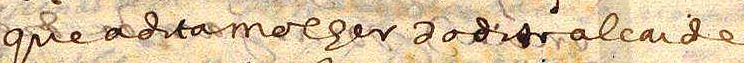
que a dita molher do dito alcaide
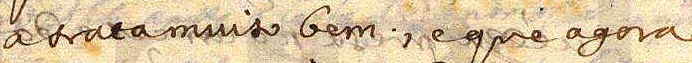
a trata muito bem, e que agora
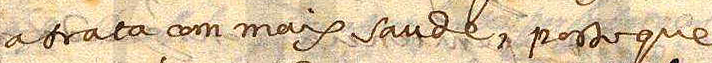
a trata com mais saude, posto que
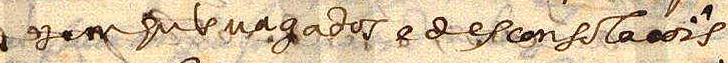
tem hus̄ uagados e desconsolacois
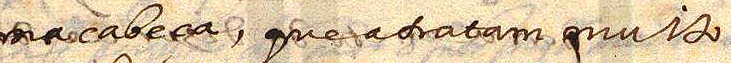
na cabeça, que a tratam muito
